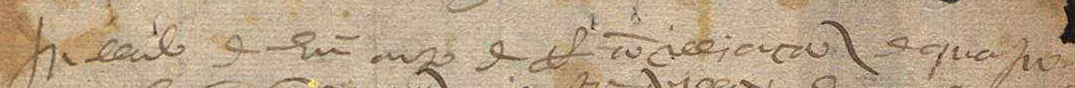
Judado de humes de Reconciliaçaõ e quatro
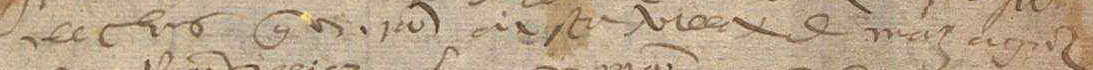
llos q̄ o cō a esta villa de maraque
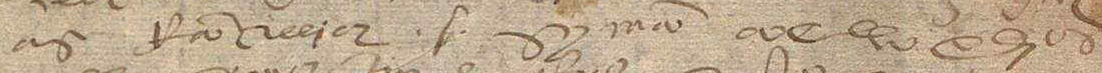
a se Raticar .s. simão collegos
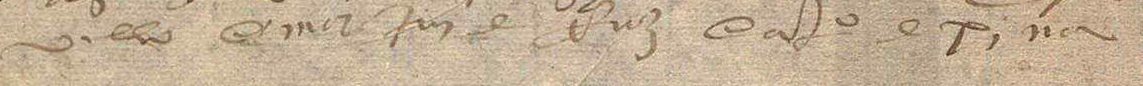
pello amortal Ruj e ato lena
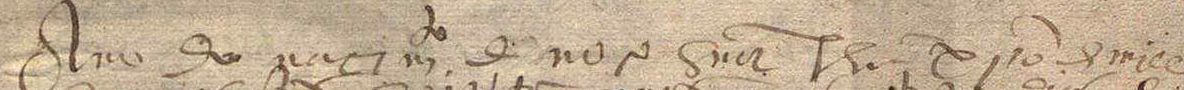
Ano do sentimto de noso Sn̄or Jhū viso de mil
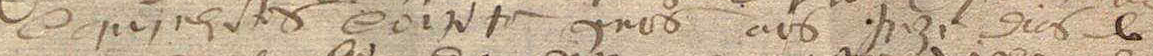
mjnhētos contēte anos aos treze dias de
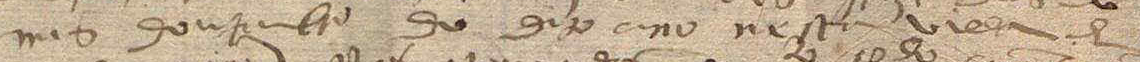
mes doutubro do dito an̄o nesta villa de
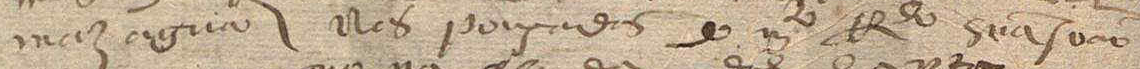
mazaguão nas pousadas do mto Rdo seu João
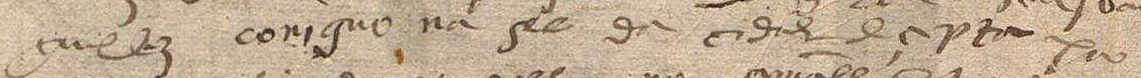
caldez com que nas da cidade de cepta po
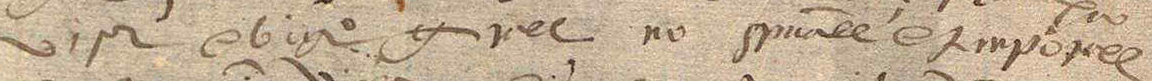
vier e vigro gerall no quall e tempore
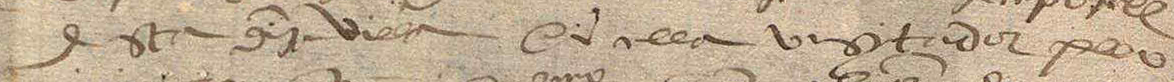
desta cadea e ē ella visitador pro
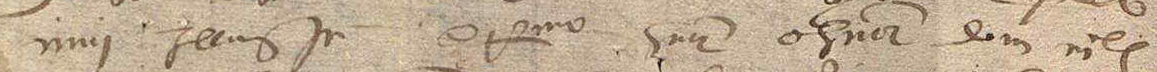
mj Jllustre e Rmo sua obrar dom mes
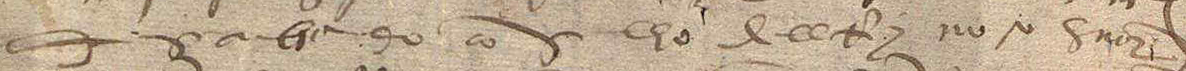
desabado c̄oselho dell Rey noso snor
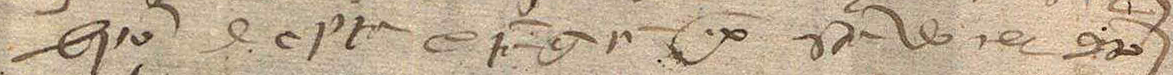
bpo de esta e segredo sādo ell dto
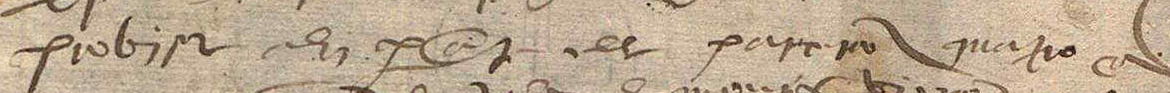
proviser ahj ꝑāte elle parece quatro ca
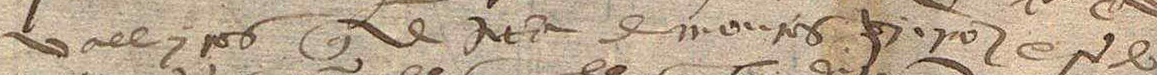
vallos q̄ detra de mouses pror e sēdo
